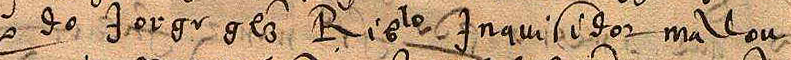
Ldo Jorge glz̄ Ribro Jnquisidor mādou
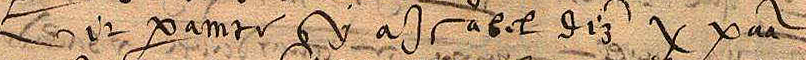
vir ꝑamte sy a Jsabel dīz Xpãa
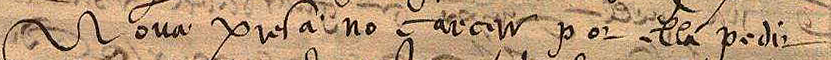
Noua presa no carcere por ella pedir
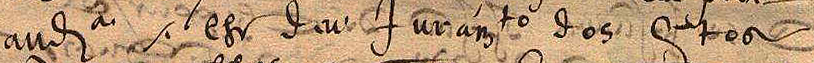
audia /. lhe deu Juramto dos Stos
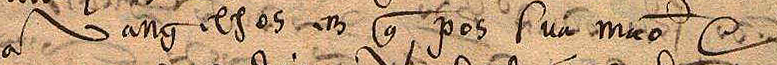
avangelhos em q̄ pos sua mão e
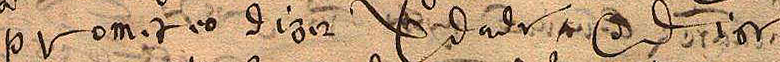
prometeo dizer Ꝟdade / e dise
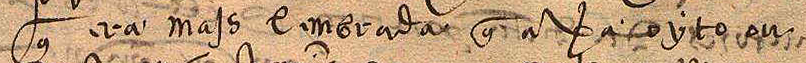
q̄ era majs lembrada q̄ aꝟa oyto ou
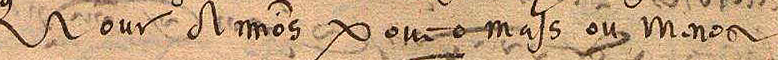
Noue Ann̄os pouco majs ou menos
